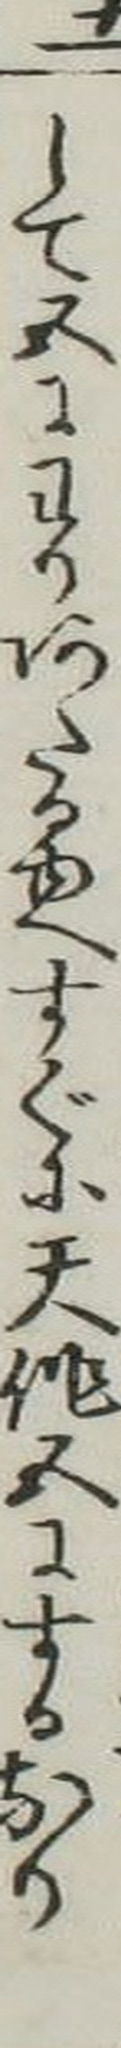して五にわりあたるゆへすぐに天作五にするなり
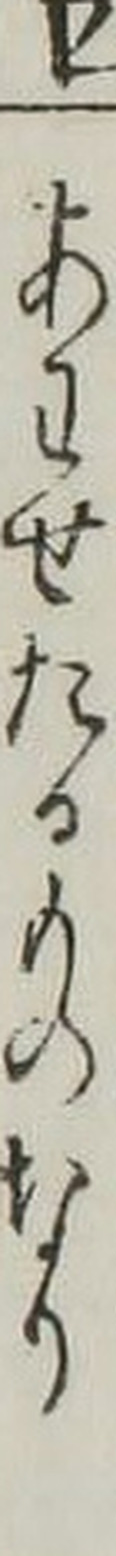あわせたるものなり
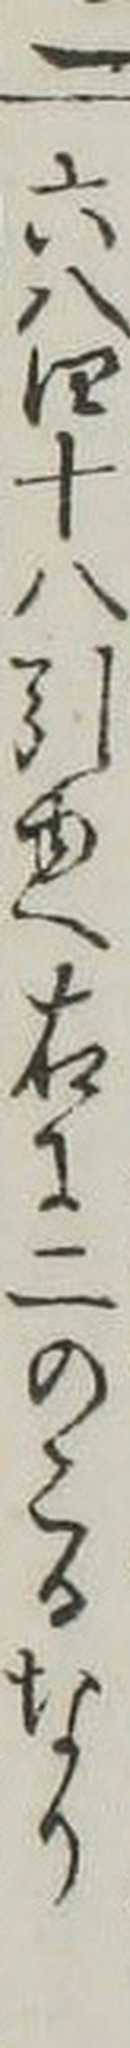六八四十八引ゆへ右に二のこるなり
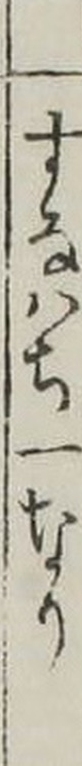すなはち一なり
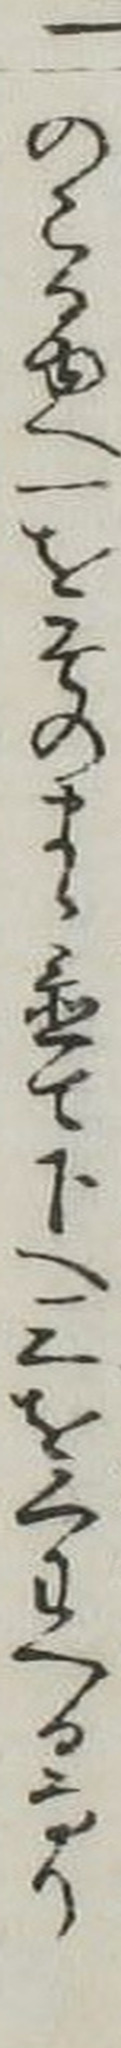のこるゆへ一をそのまゝ置て下へ三をくわへるなり
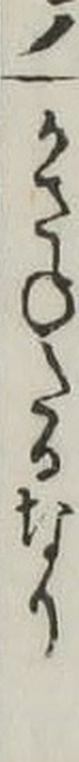かさねたるなり
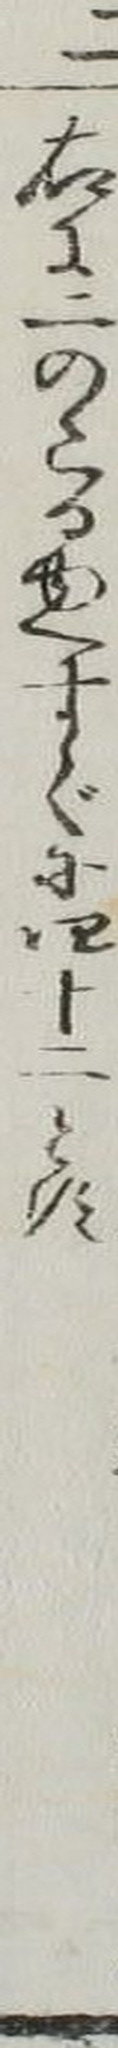右に二のこるゆへすぐに四十二とす
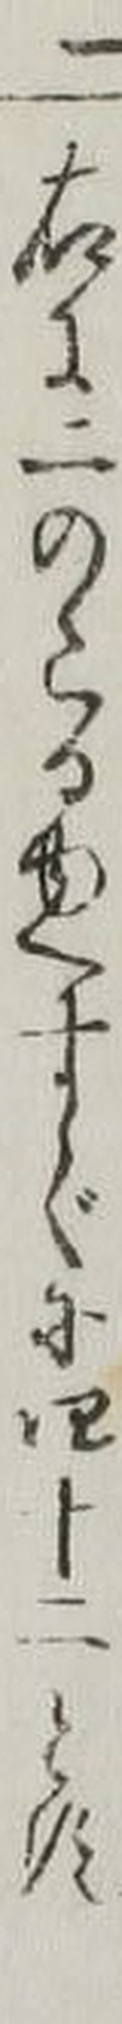右に二のこるゆへすぐに四十二とす
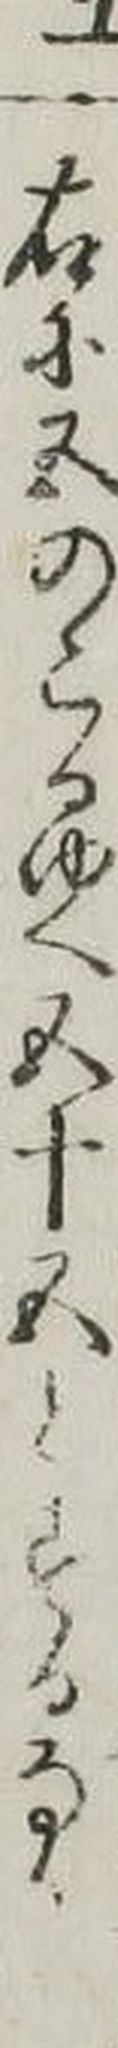右に五のこるゆへ五十五とするなり
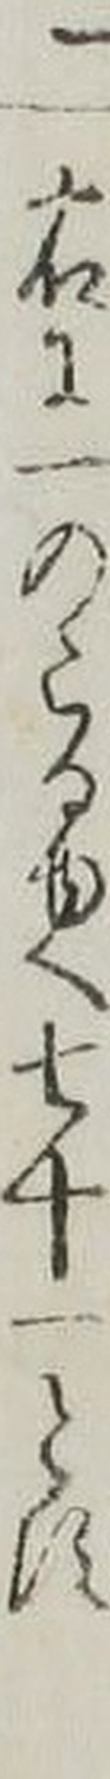右に一のこるゆへ七十一とす
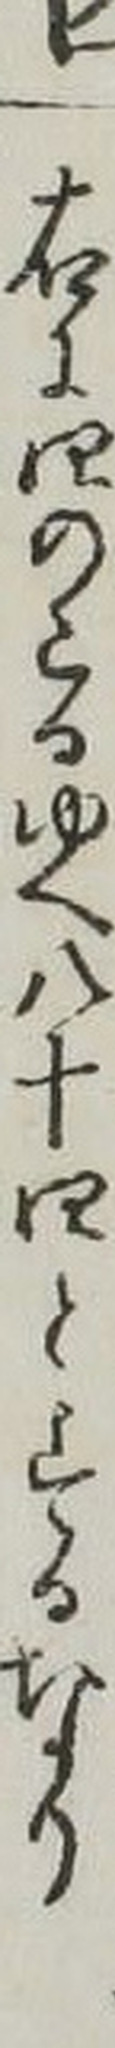右に四のこるゆへ八十四とするなり
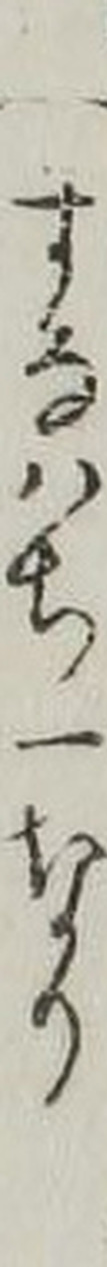すなはち一なり
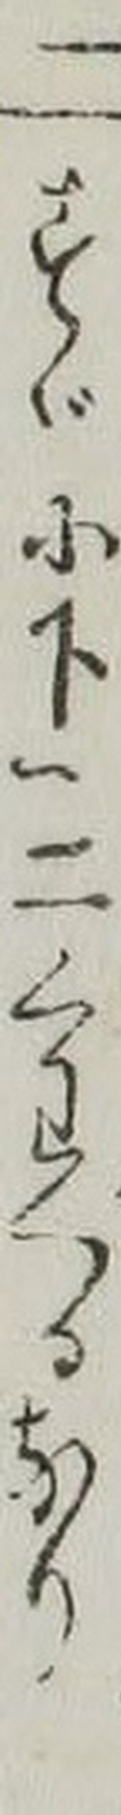すぐに下へ二くわへるなり
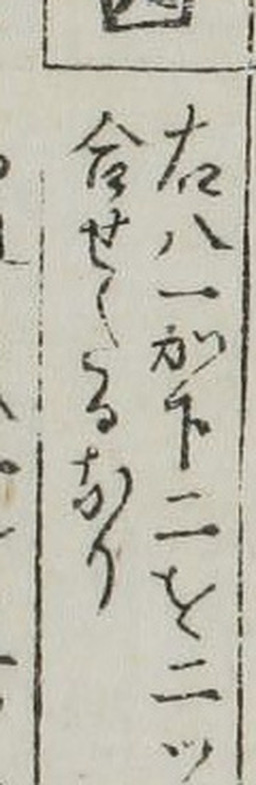合せたるなり
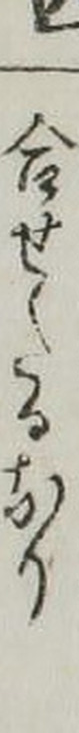合せたるなり
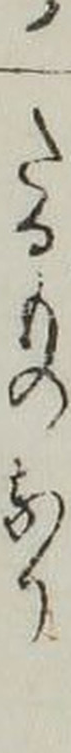たるものなり
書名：宝玉塵劫記
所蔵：東京学芸大学教育コンテンツアーカイブ
